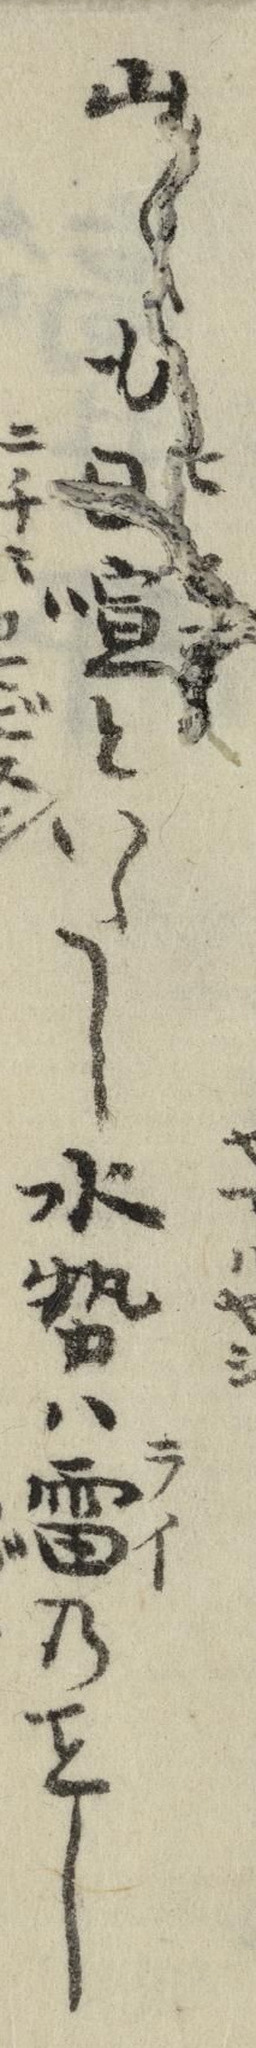山〳〵も日喧といたし水勢ハ雷乃ことし
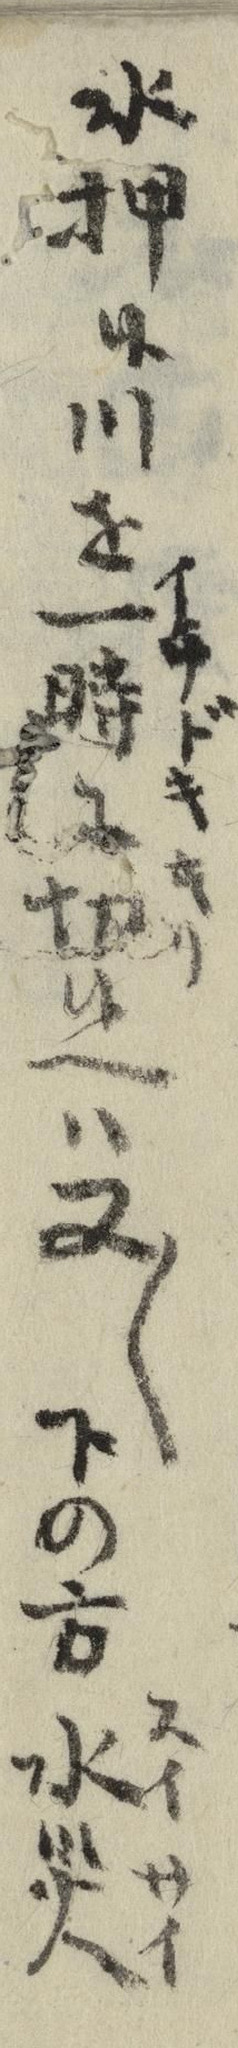水押候川を一時に切候へハ又〳〵下の方水災
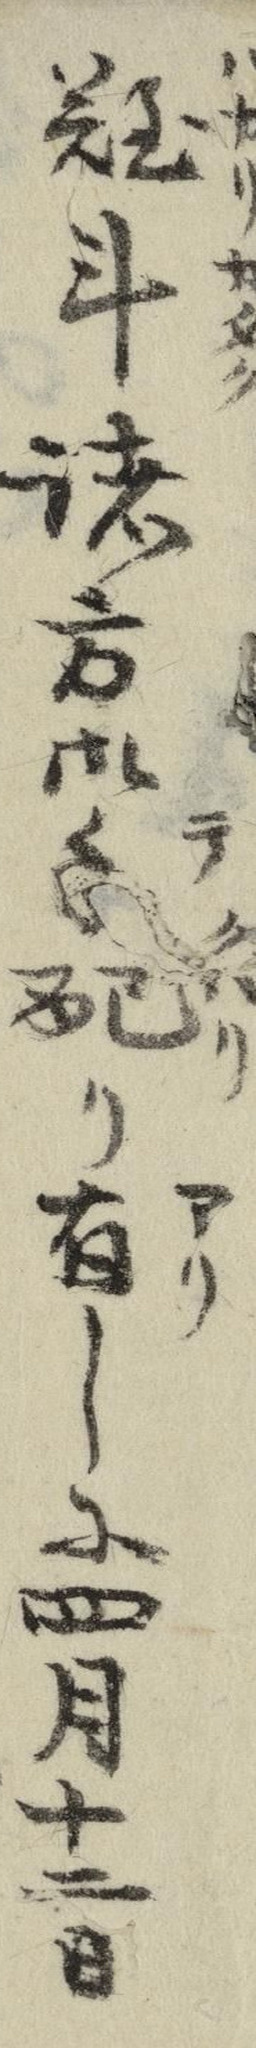難計諸方御手配り有しに四月十二日
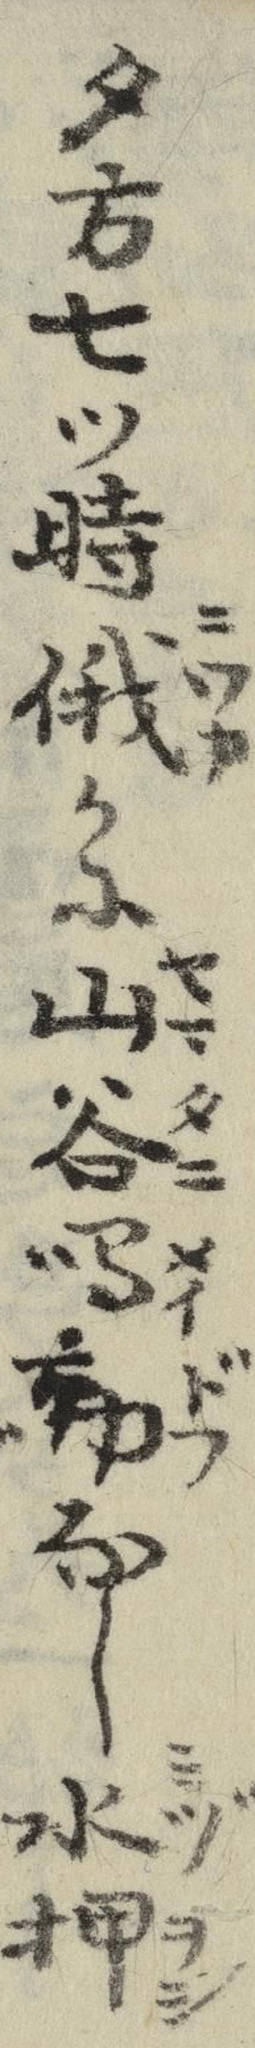夕方七ッ時俄かに山谷鳴動なし水押
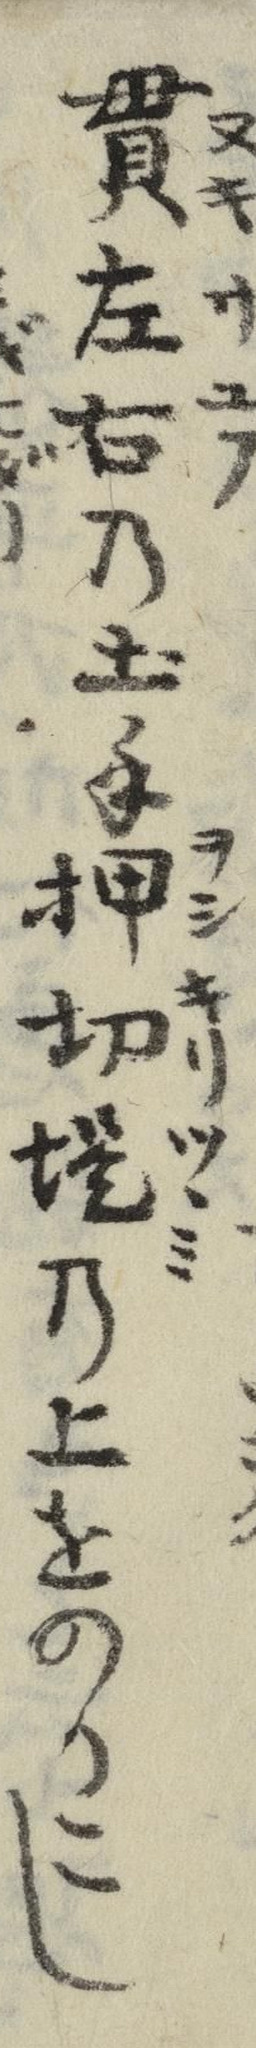貫左右乃土手押切堤乃上をのりこし
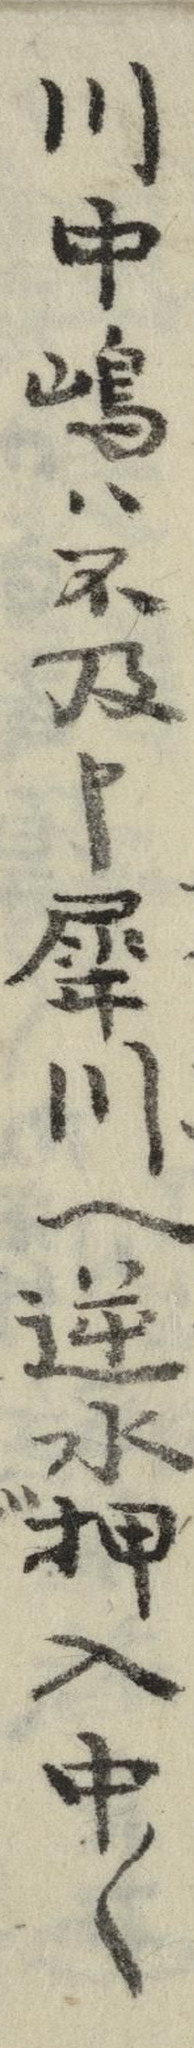川中島ハ不及申犀川へ逆水押入中〳〵
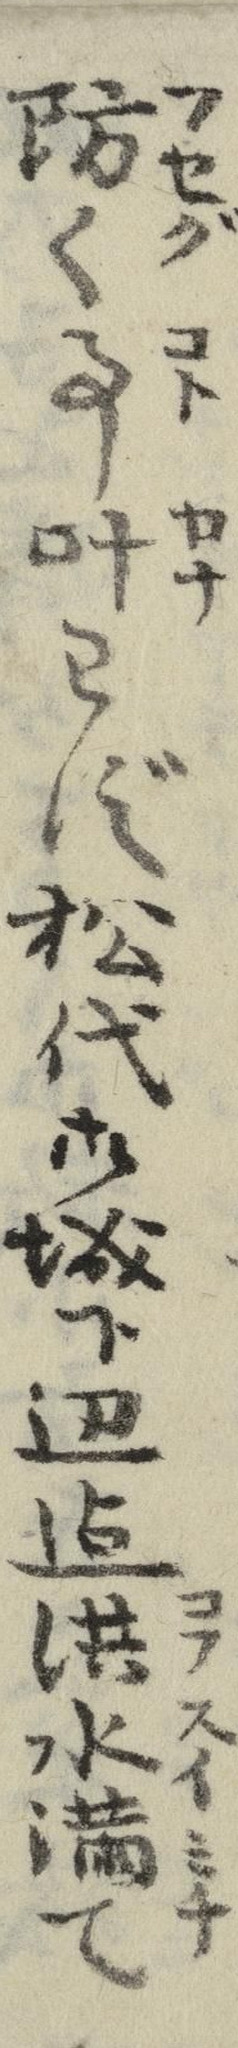防ぐ事叶わず松代御城下迄洪水満て
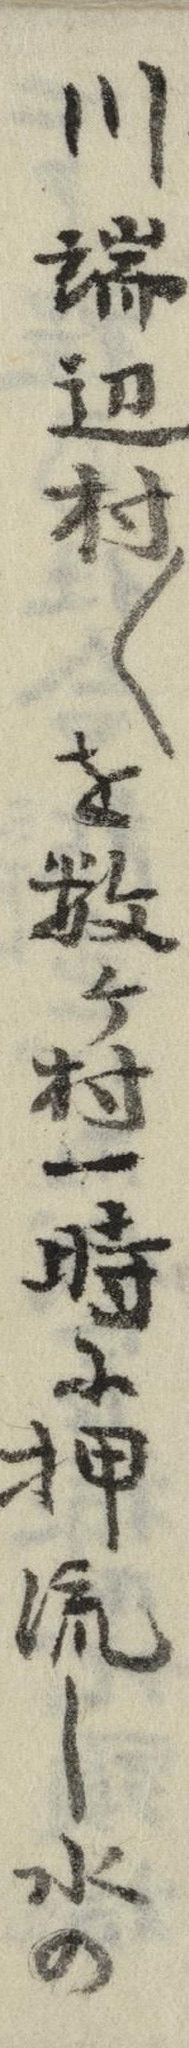川端辺村〳〵を数ヶ村一時に押流し水の
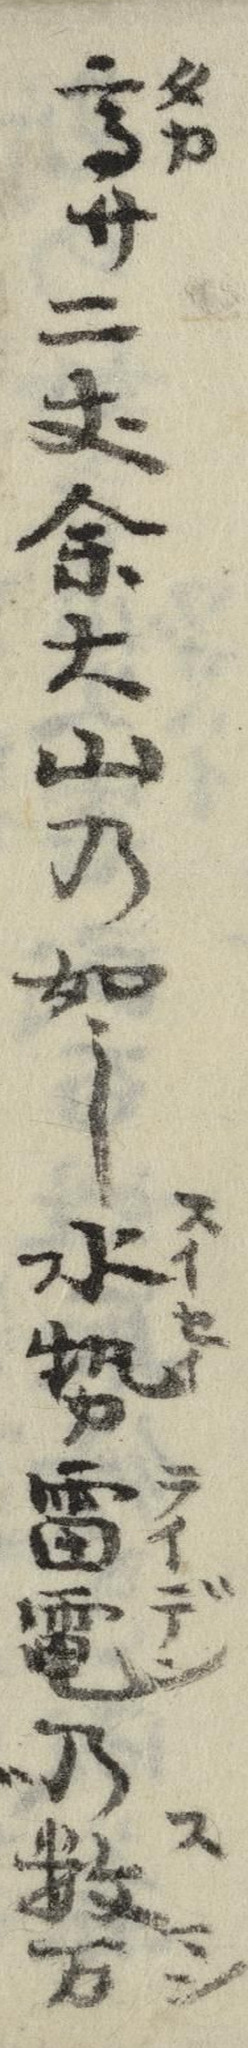高サ二丈余大山の如し水勢雷電乃数万
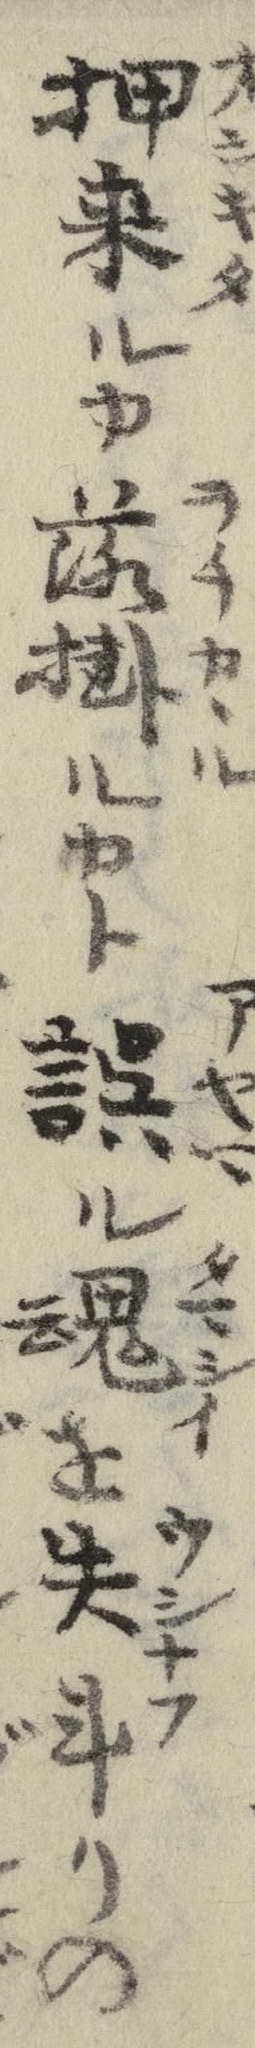押来ㇽカ落掛ルカト誤ㇽ魂を失計りの
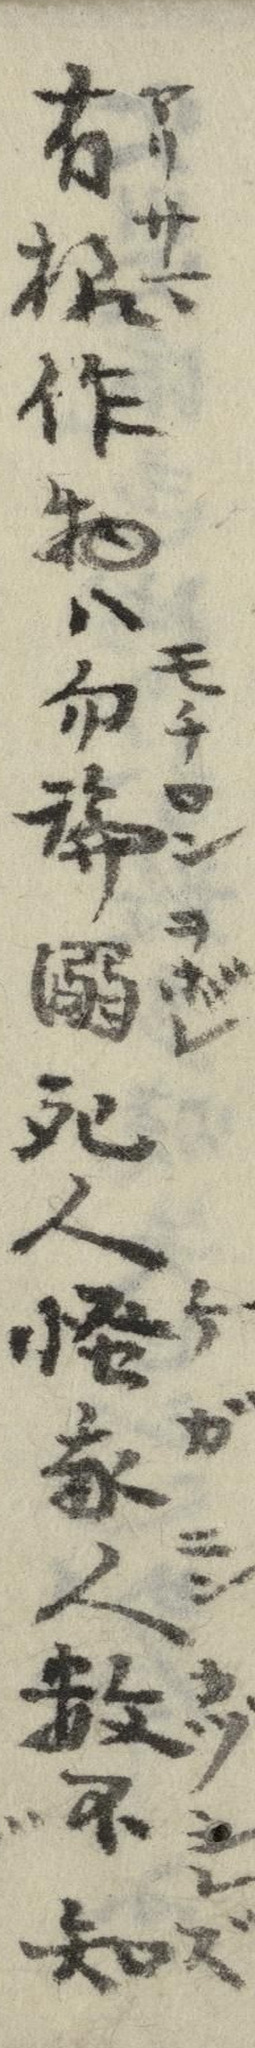有様作物ハ勿論溺死人怪我人数不知
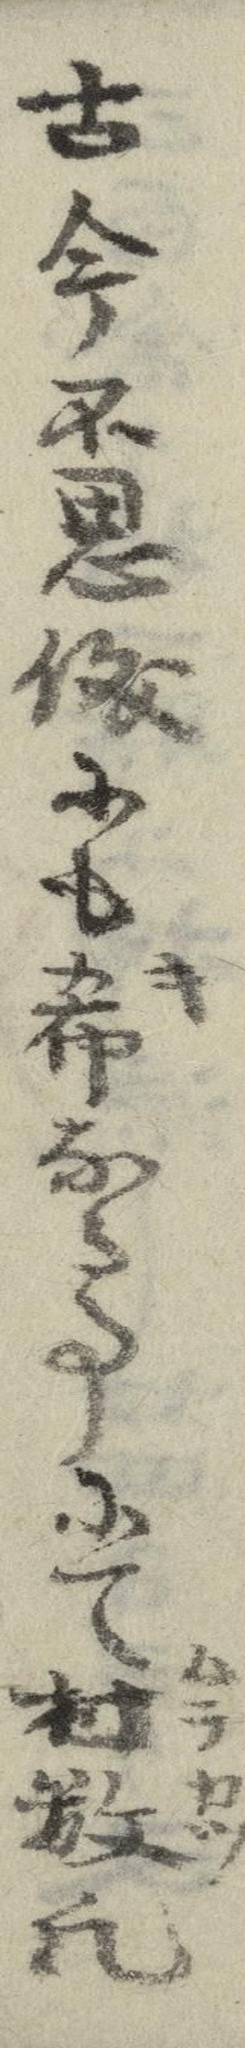古今不思議にも希なる事にて村数凡

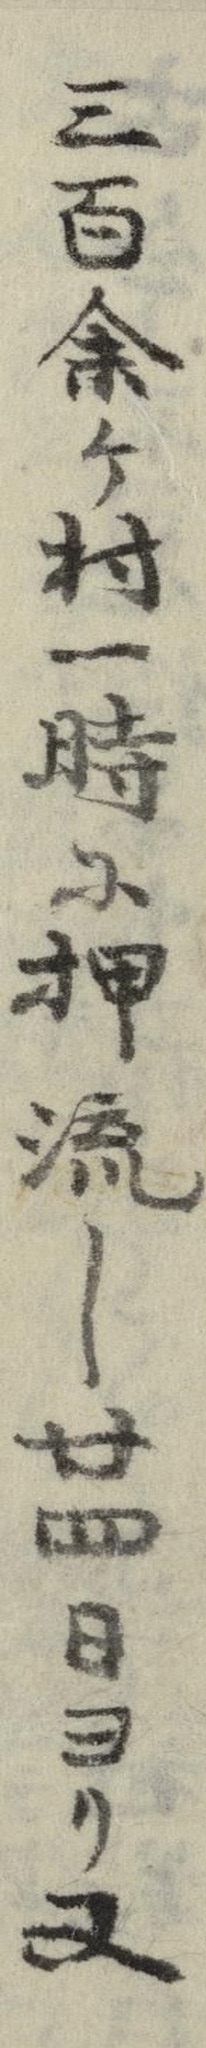三百余ヶ村一時に押流し廿四日ヨリ又
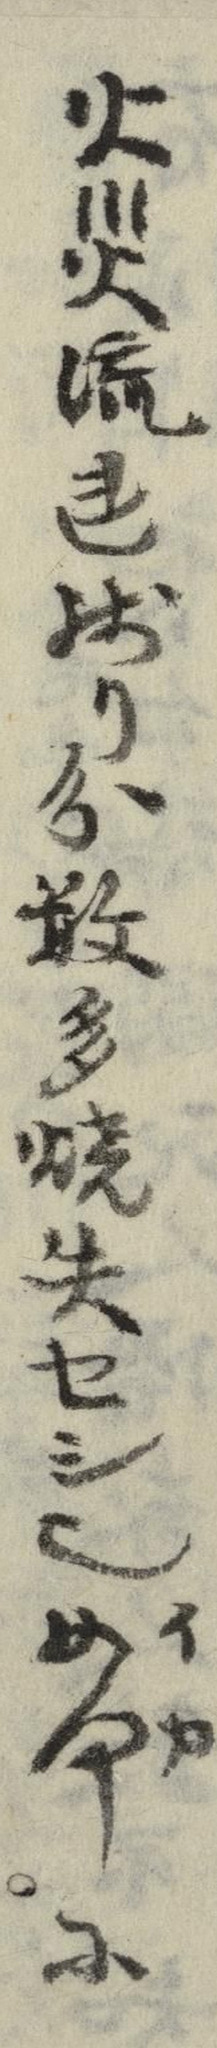火災流れ残り分数多焼失セシ也如何に
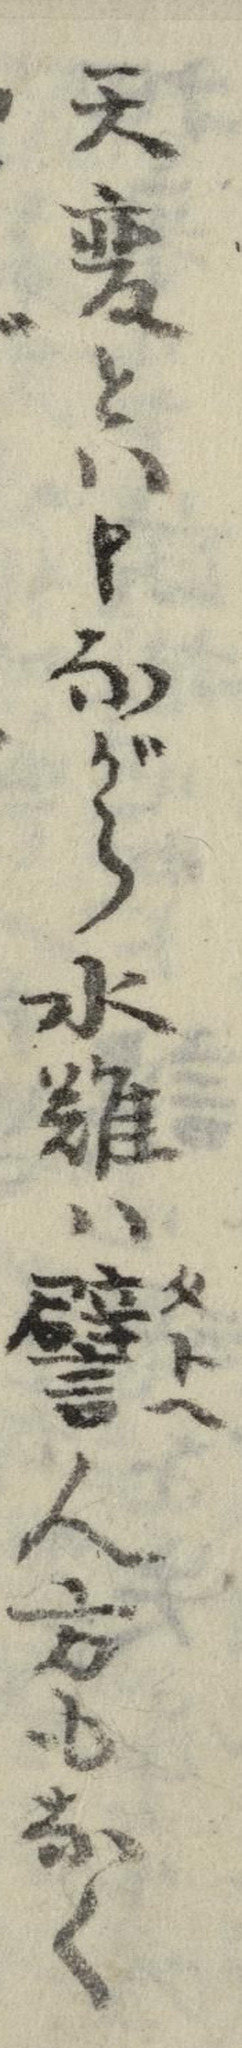天変とハ申ながら水難ハ譬ん方もなく
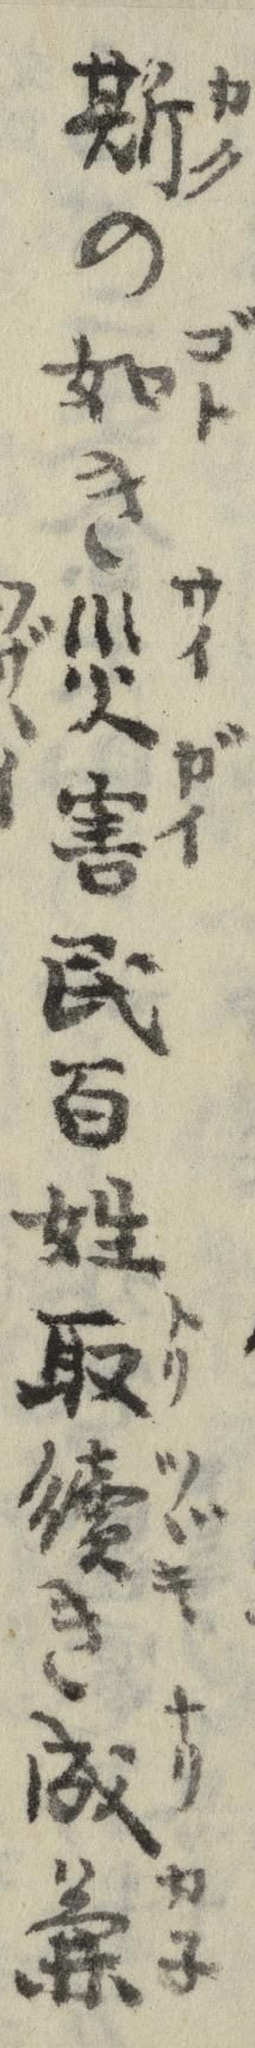斯の如き災害民百姓取続き成兼
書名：信州大地震一件之冩　丁未弘化四年三月吉日
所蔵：東京大学地震研究所図書室 Earthquake Research Institute Library, The University of Tokyo, JAPAN
